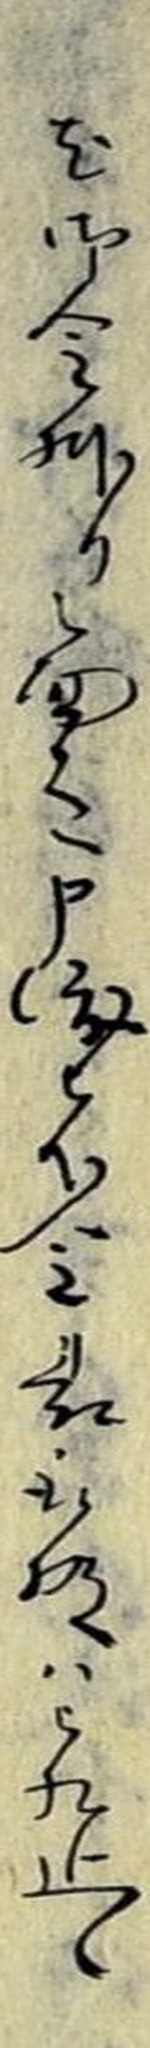尤御金掛り之面々へ申渡被下金表取扱は被相止候
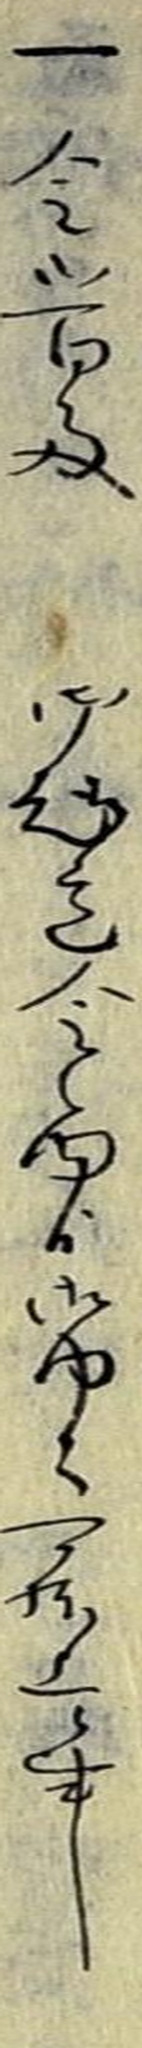一金弐百両御趣意金之内ゟ御内々可指上候事
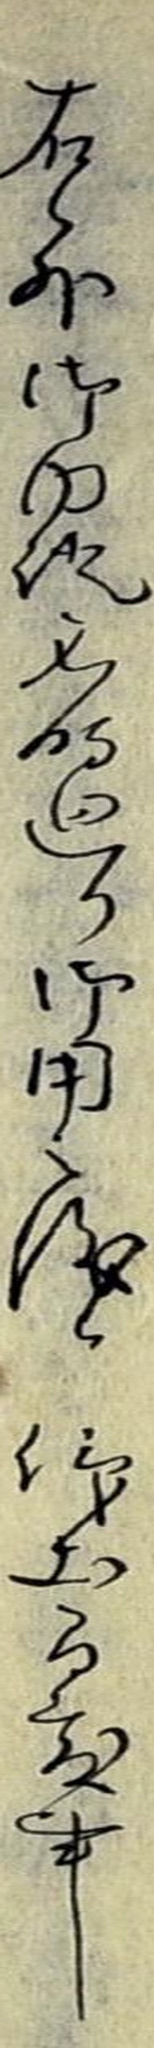右之外御内証不時廻り御用之儀被仰出間敷事
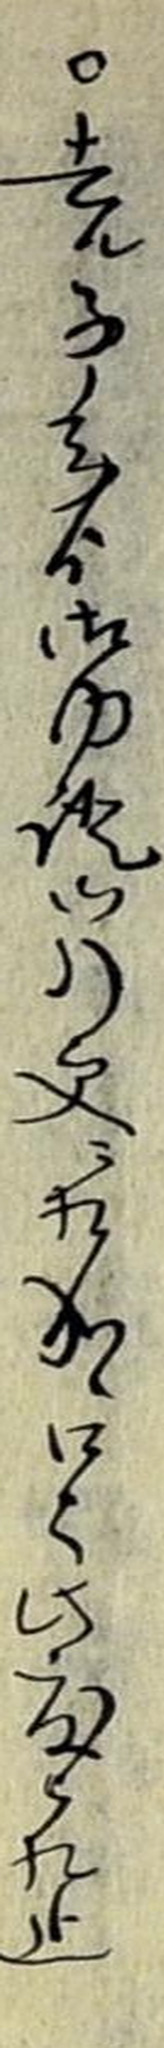〇去る子年ゟ御内証御引受に相成候口々此度被相止坂井半十郎
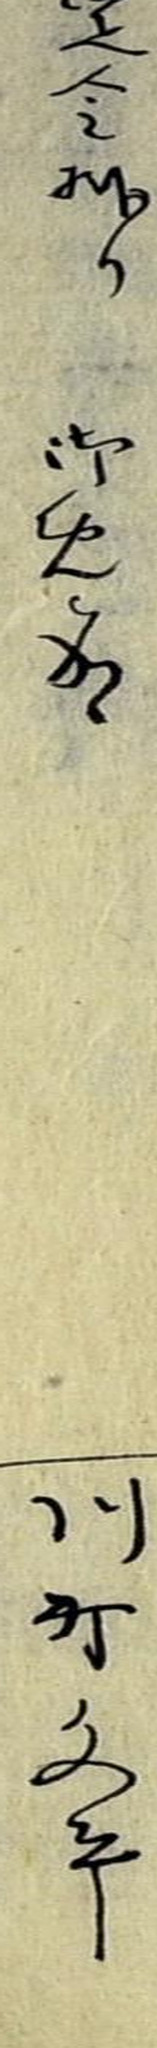御定金掛り御免被成候川村文平
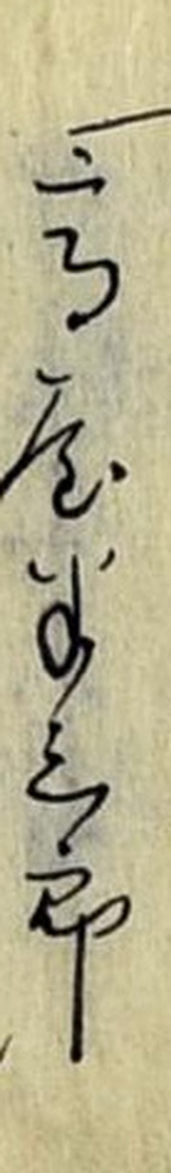高屋半三郎
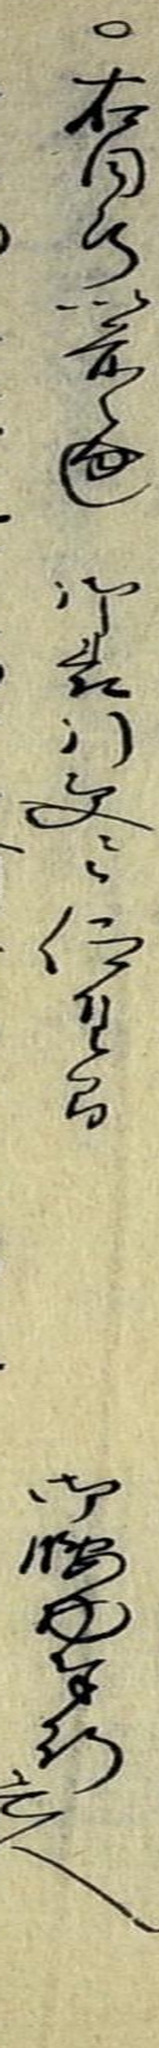〇右同断以前之通御表引受に被仰付候間御腰物奉行壱人
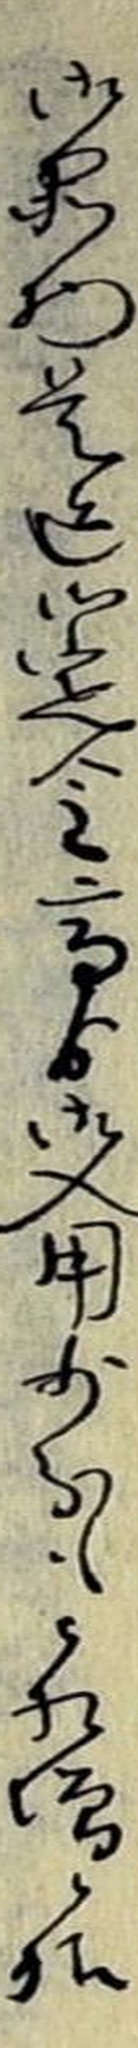御品物是迄御定金高ゟ御入用少分も被相増候様
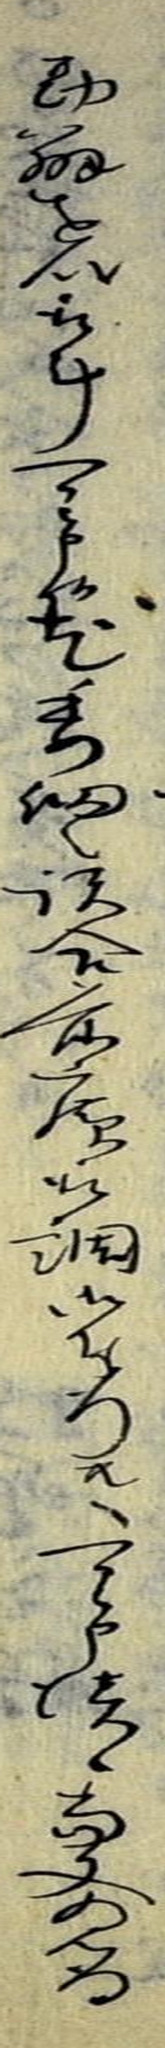勘弁を以取斗可被申候尤委細之訳合前広取調御奉行共へ可被申談候尚又為心得
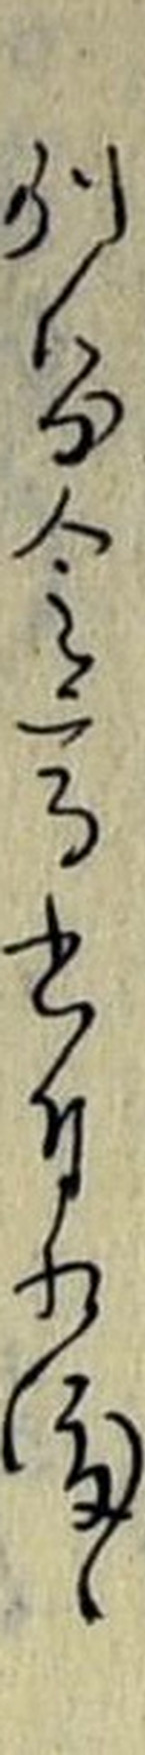別紙金高書付相渡候
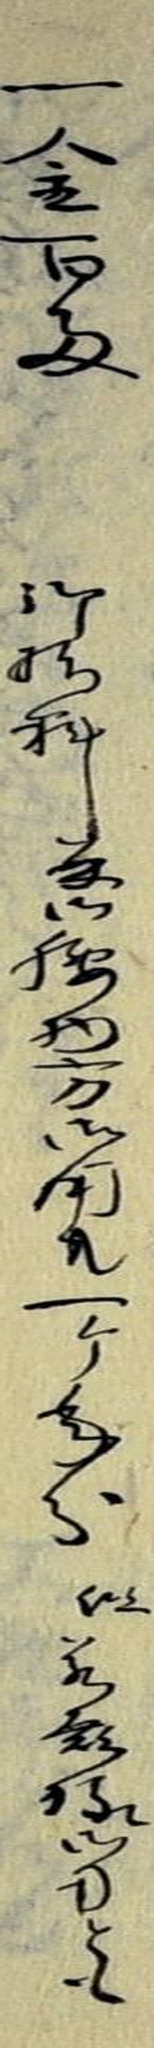一金百両御指料并御腰物方御用共一ケ年分但若殿様御用とも
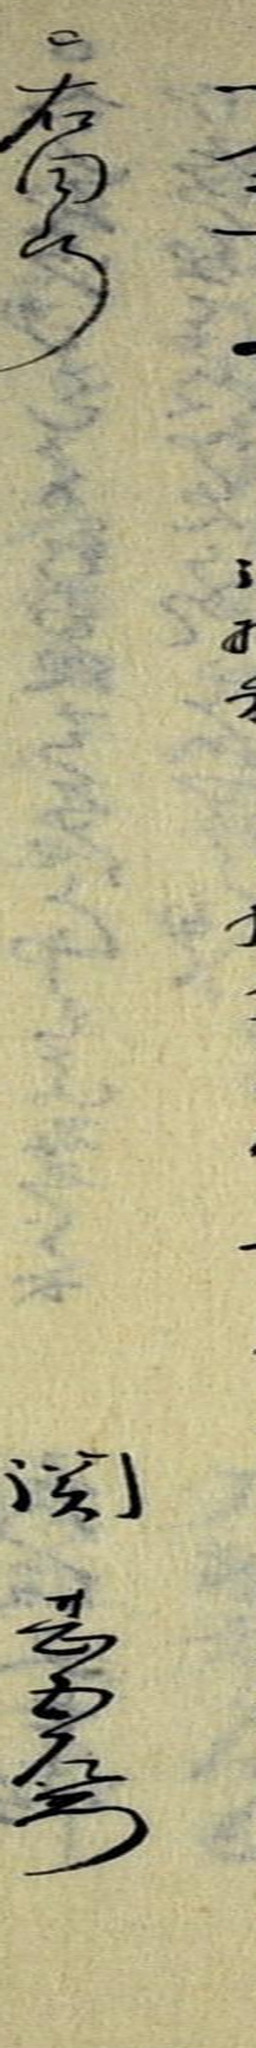〇右同断関甚五左衛門
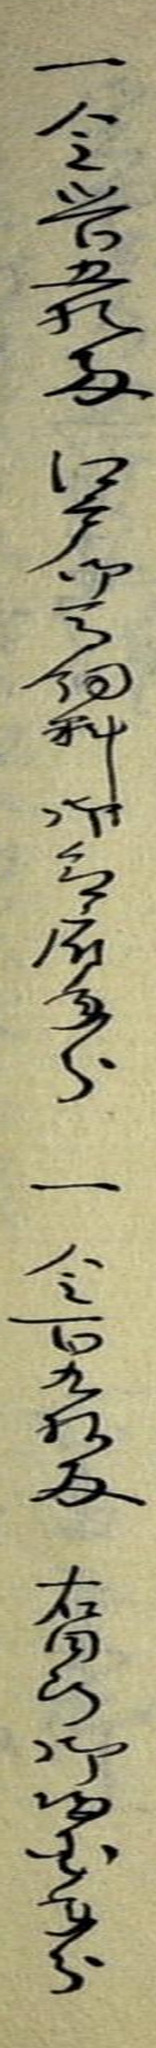一金弐百五拾両江戸御馬飼料御参府年分一金百九拾両右同断御帰国年分
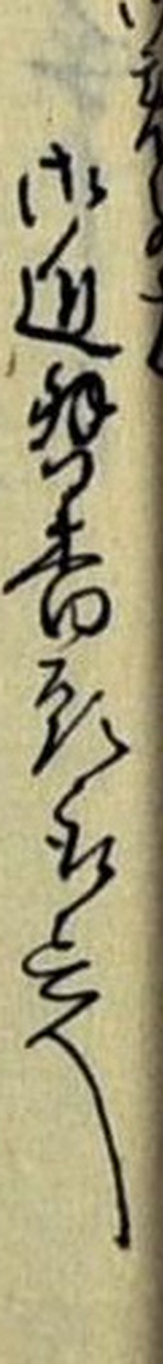御近習番頭取壱人
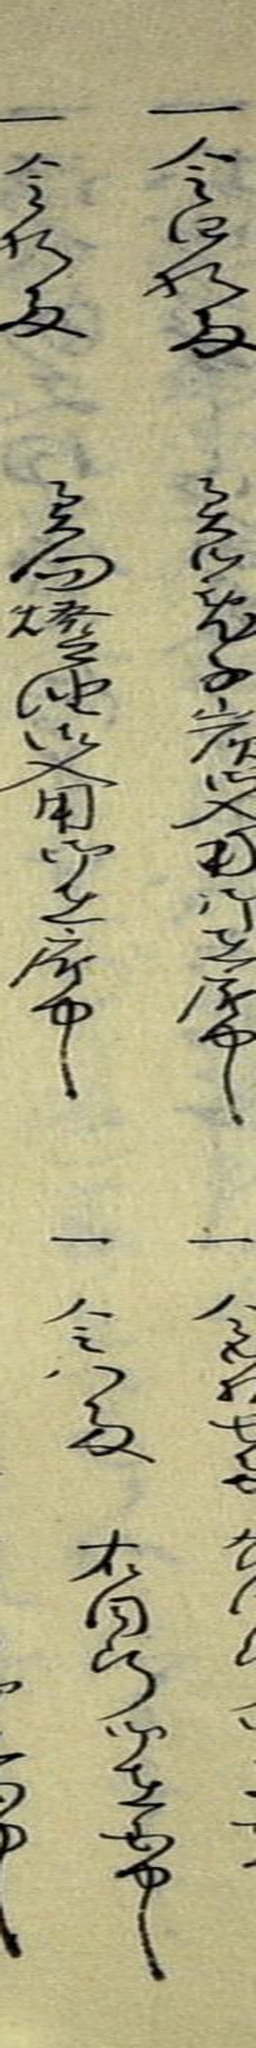一金拾両奥向灯油御入用御在府中一金八両右同断御在国中
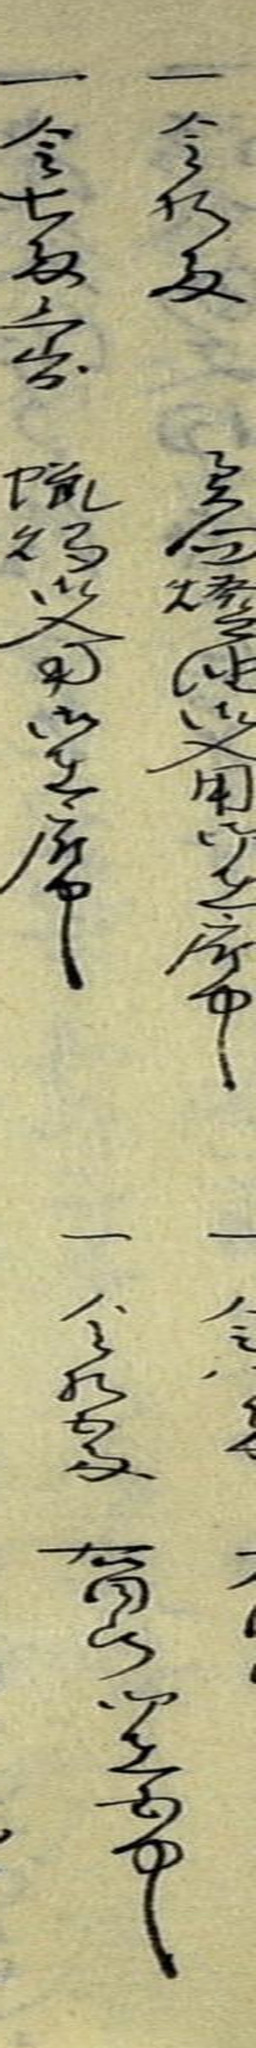一金七両三歩蝋燭御入用御在府中一金拾五両右同断御在国中
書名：命令之部 二
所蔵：福井県文書館 Fukui Prefectural Archives
